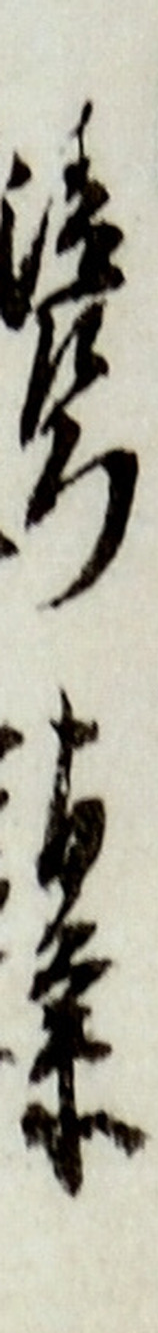後左衛門与兵衛
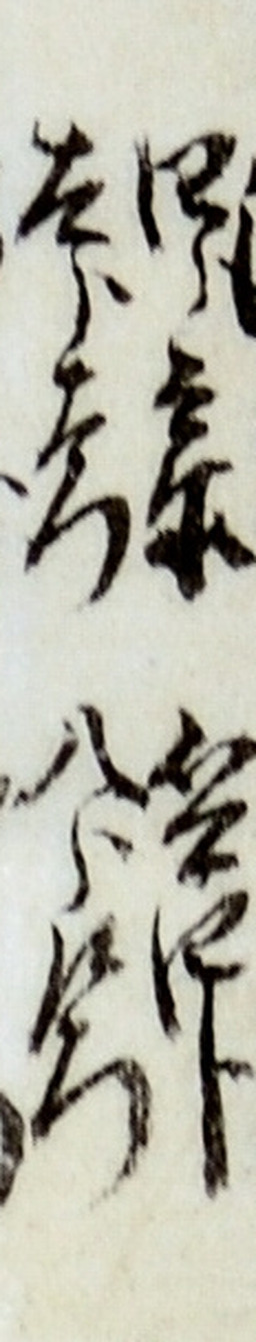太郎右衛門八郎左衛門
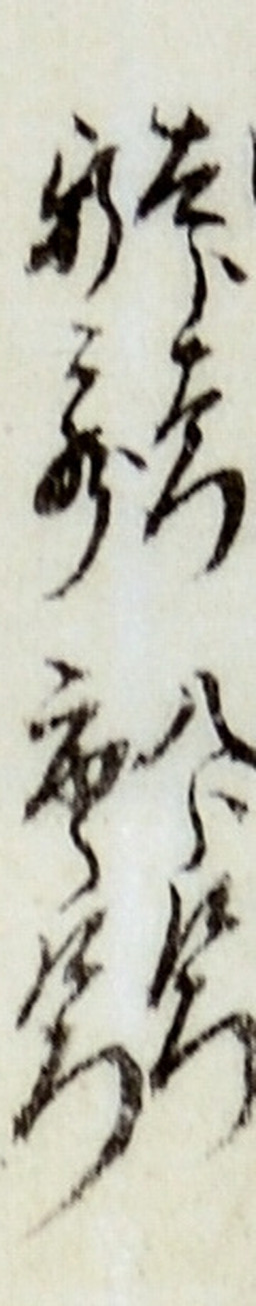新蔵市郎左衛門
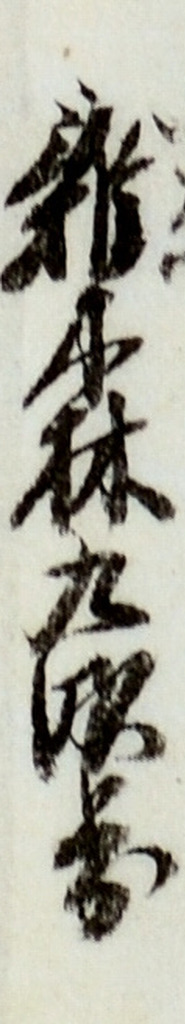雑木林壱町歩
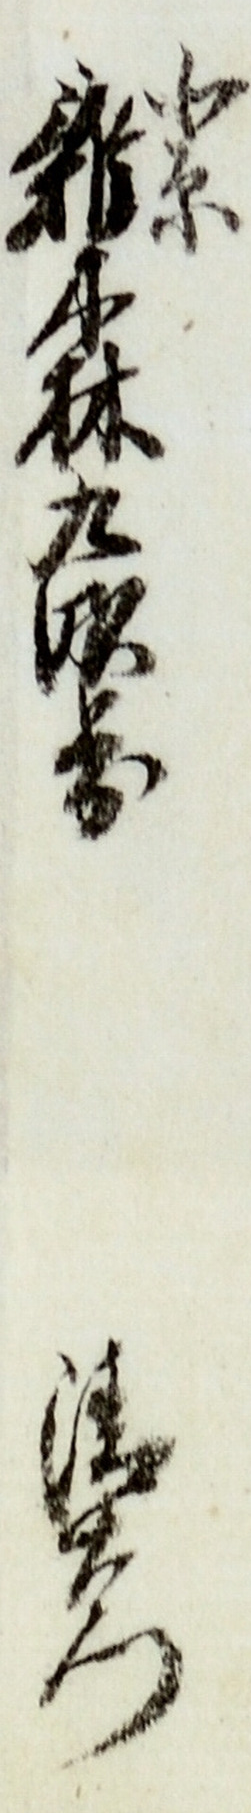雑木林九畝歩清右衛門
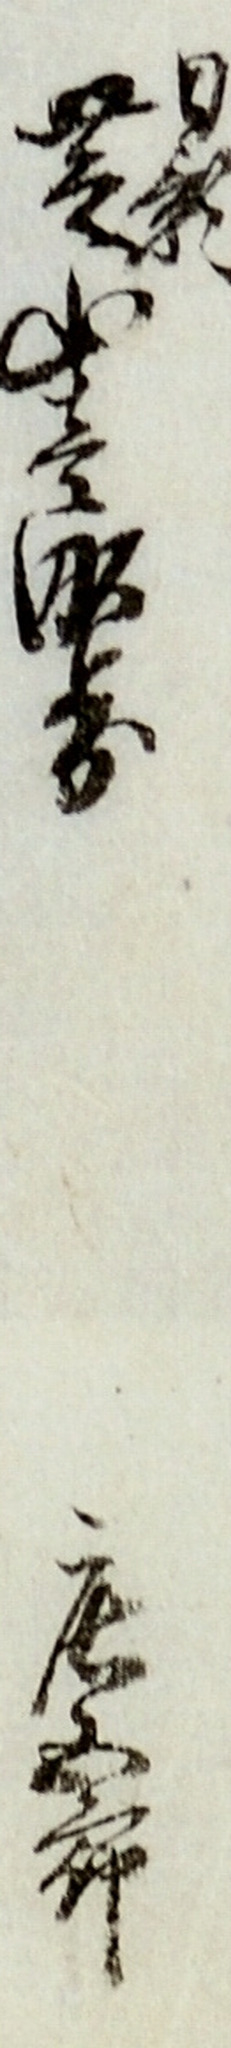芝山壱畝歩庄五郎
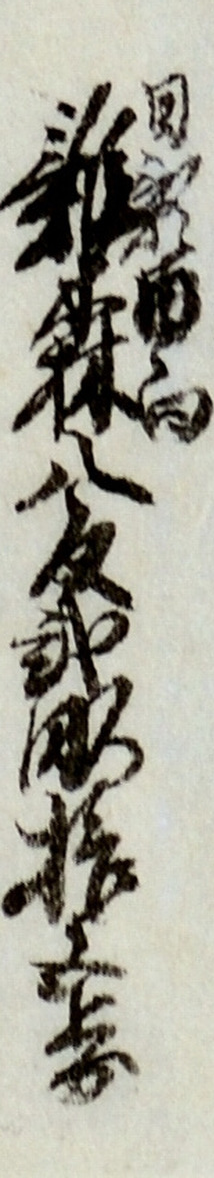雑木林八反弐畝拾五歩
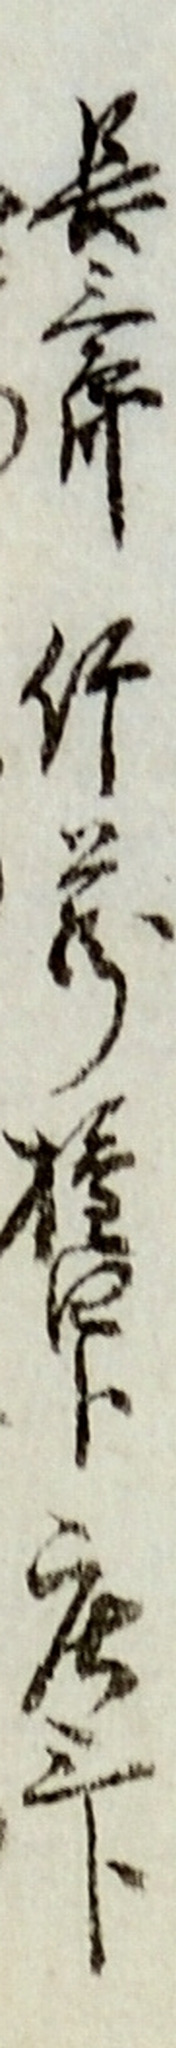長三郎竹蔵権四郎庄三郎
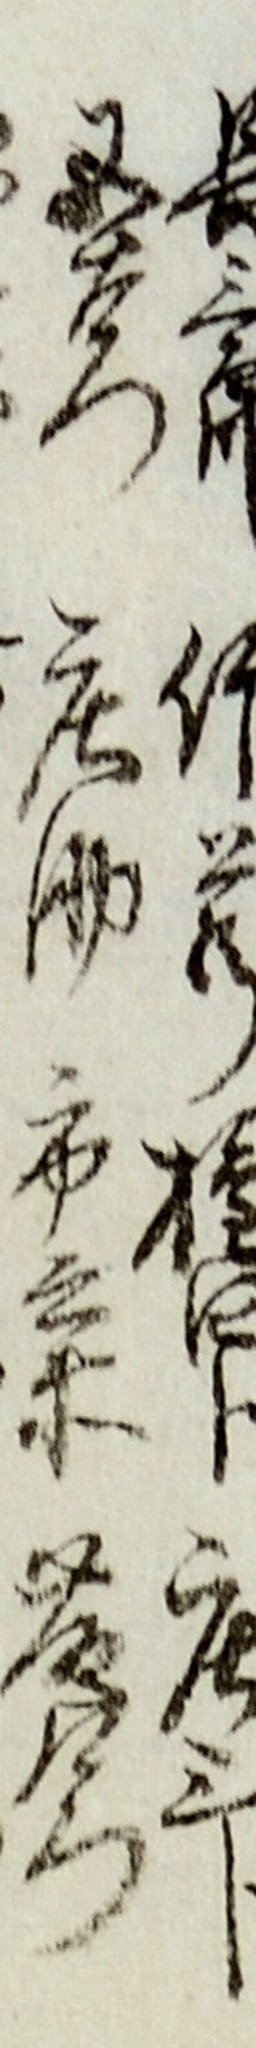五右衛門庄助市兵衛藤左衛門
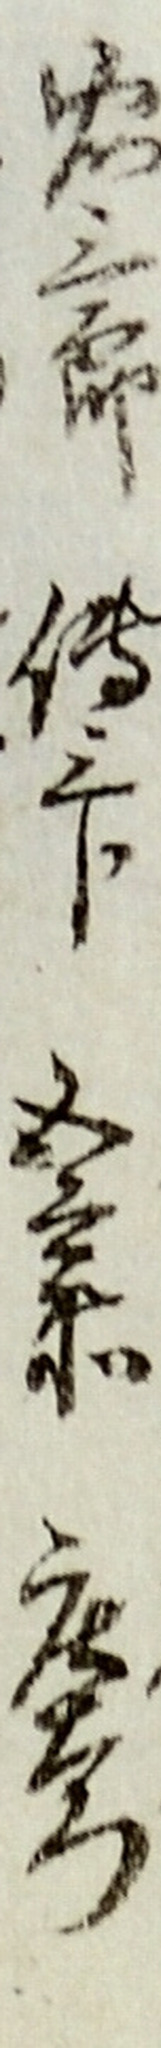忠三郎伝三郎五兵衛庄右衛門
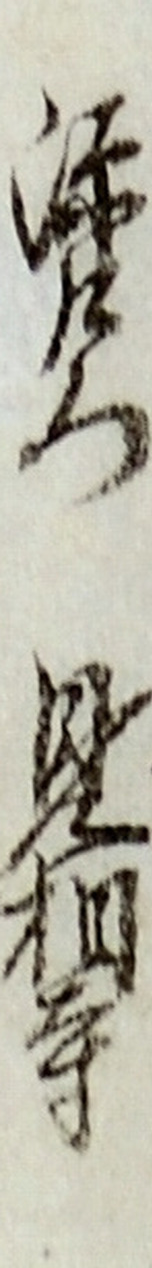源左衛門見相寺
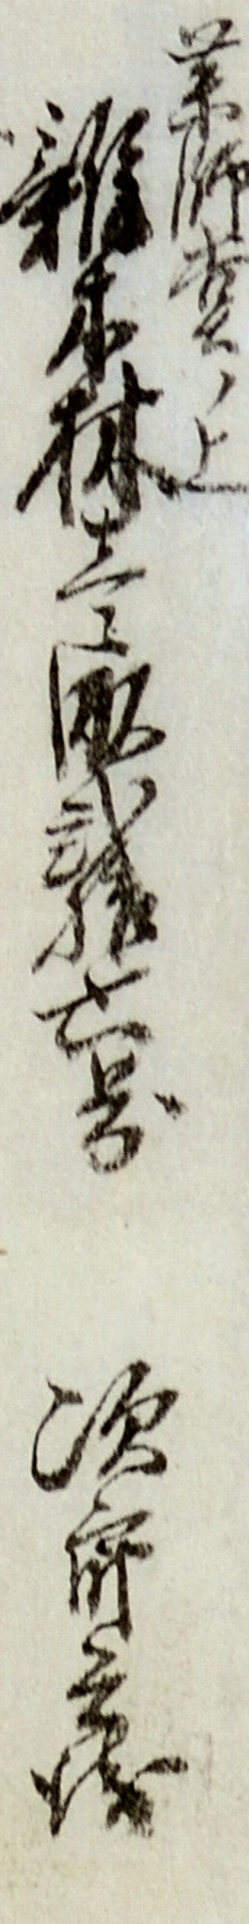雑木林壱畝弐拾六歩次郎兵衛
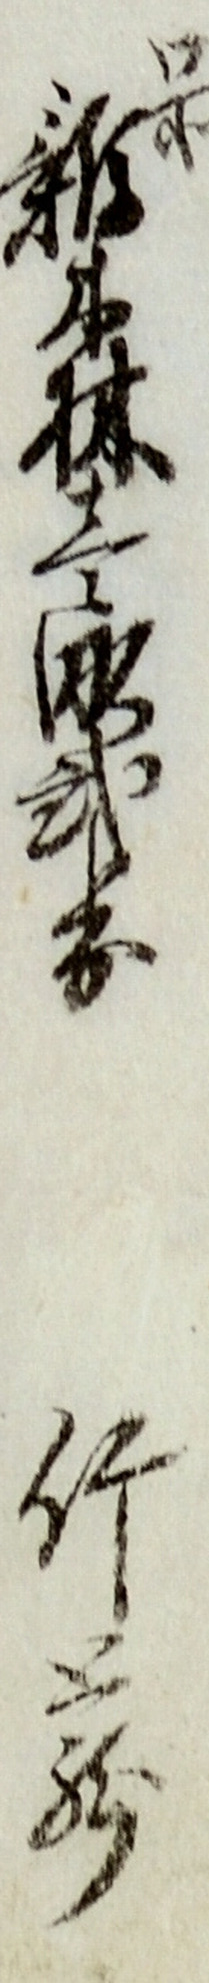雑木林壱畝弐歩竹蔵
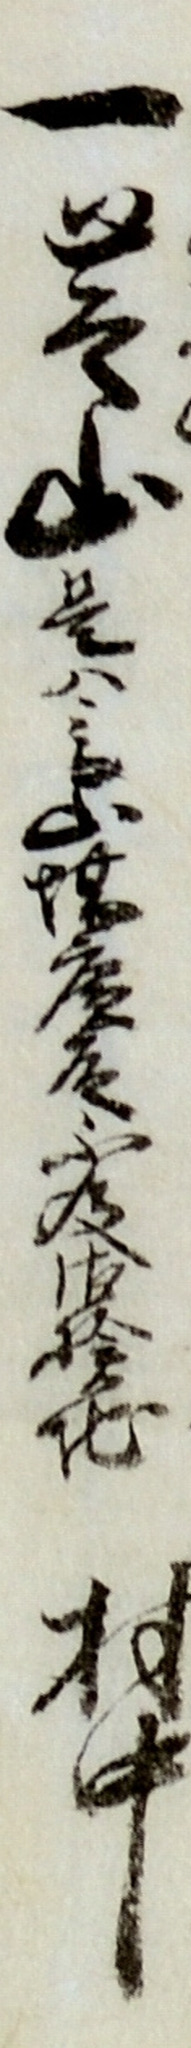一芝山是ハ高山場広故不及御検地村中
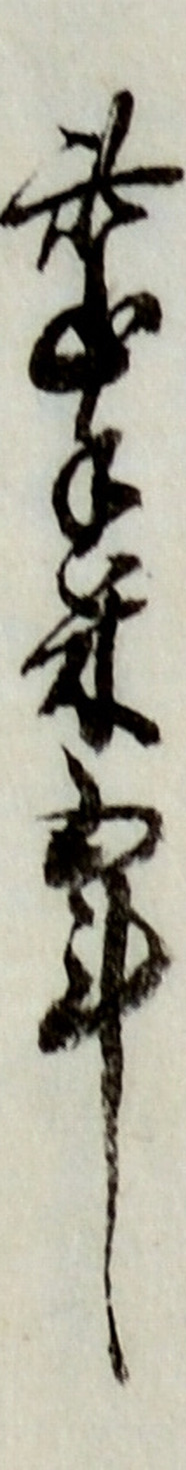此山手米五斗

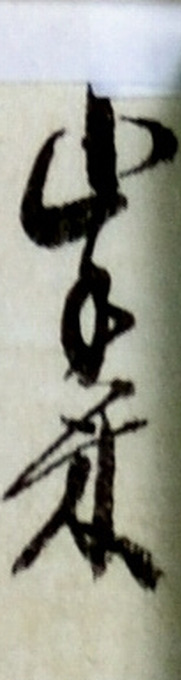山手米
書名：御領分中山林社地手控
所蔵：伊那市立高遠町図書館・合同会社AMANE
